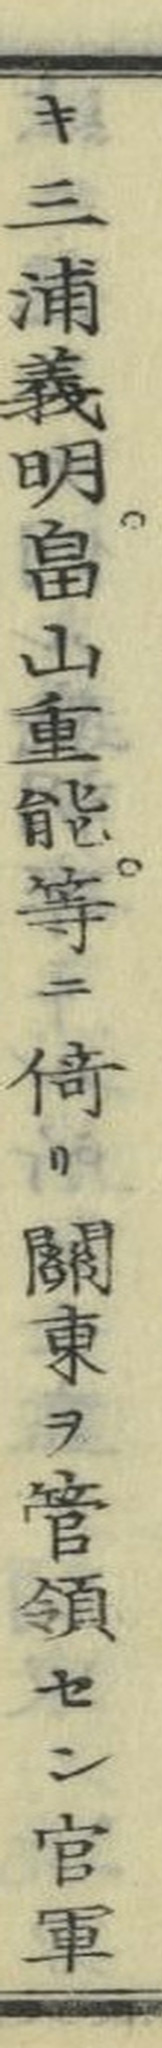キ三浦義明。畠山重能。等ニ倚リ關東ヲ管領セン官軍
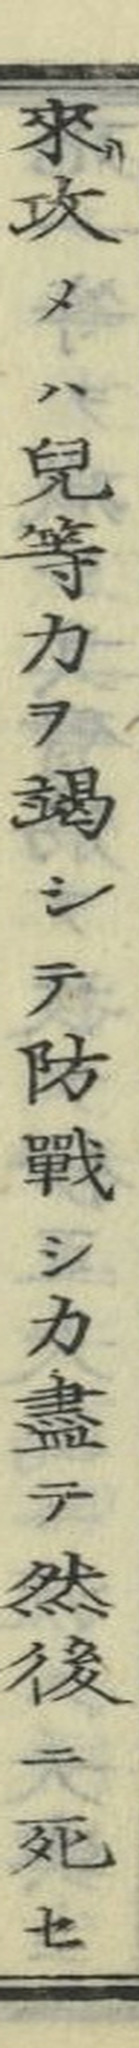來攻メハ兒等力ヲ竭シテ防戰シカ盡テ然後ニ死セ
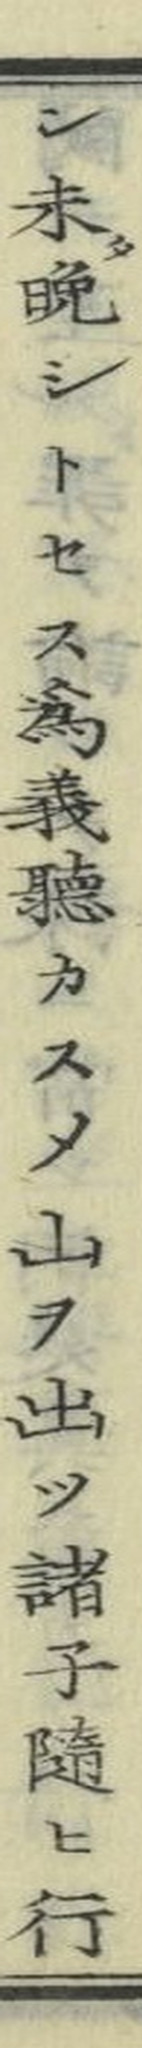ン未晚シトセス爲義聽カスシテ山ヲ出ツ諸子隨ヒ行
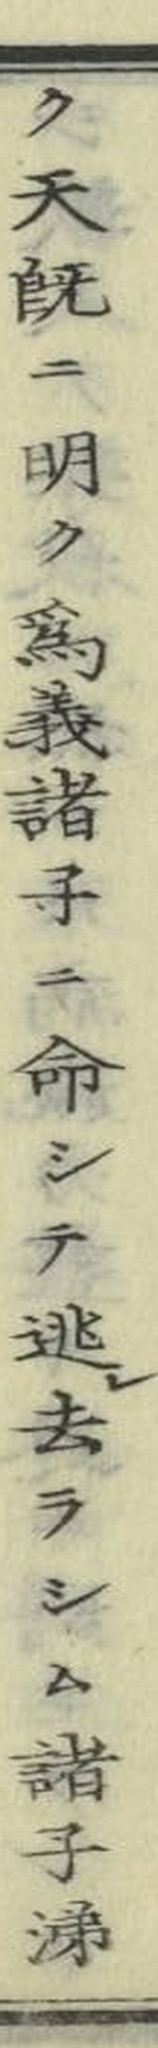ク天既ニ明ク爲義諸子ニ命シテ逃去ラシム諸子涕
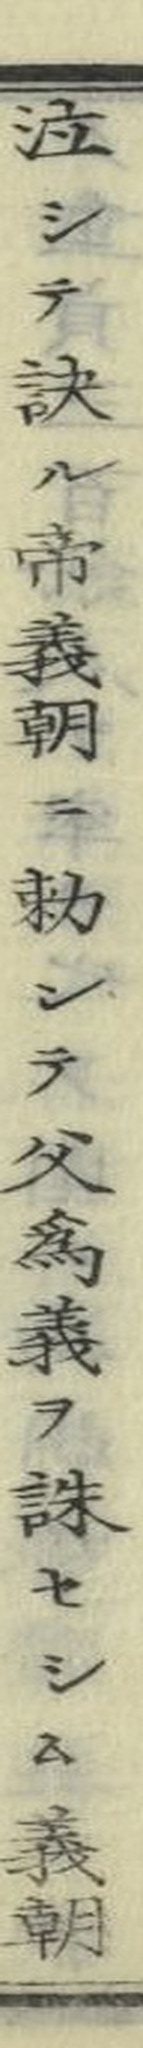注シテ訣ル帝義朝ニ勅シテ父爲義ヲ誅セシム義朝
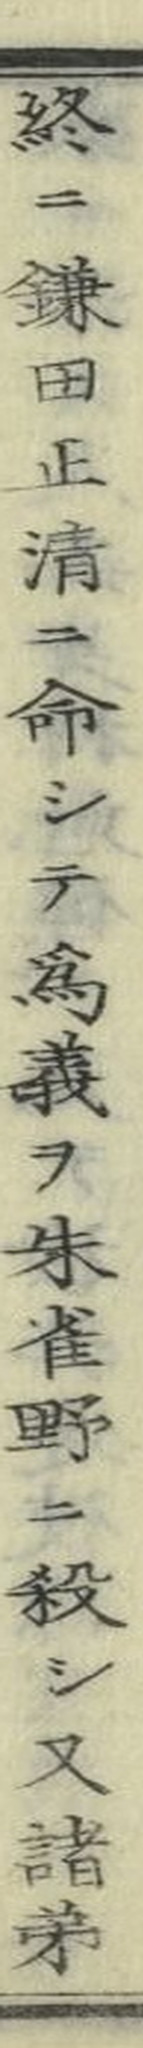終ニ鎌田正清ニ命シテ爲義ヲ朱雀野ニ殺シ又諸弟
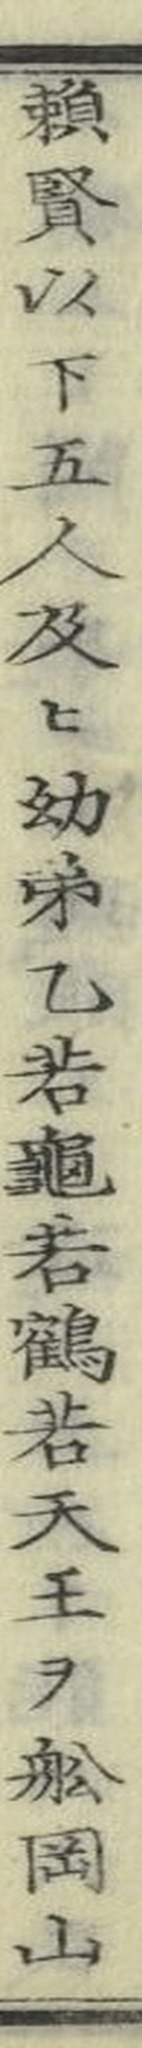頼賢以下五人及ヒ幼弟乙若龜若鶴若天王ヲ舩岡山
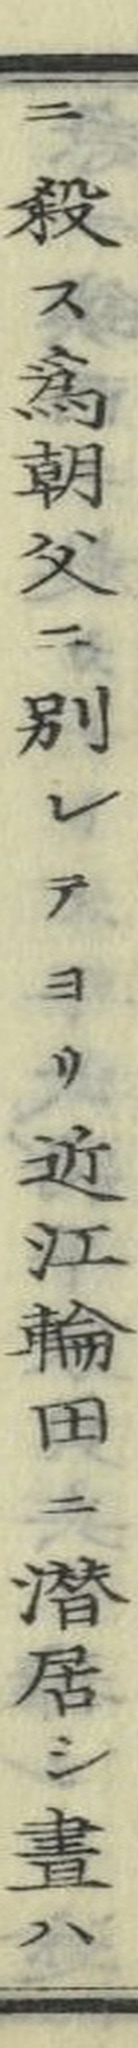ニ殺ス爲朝父ニ别レテヨリ近江輪田ニ潜居シ晝ハ
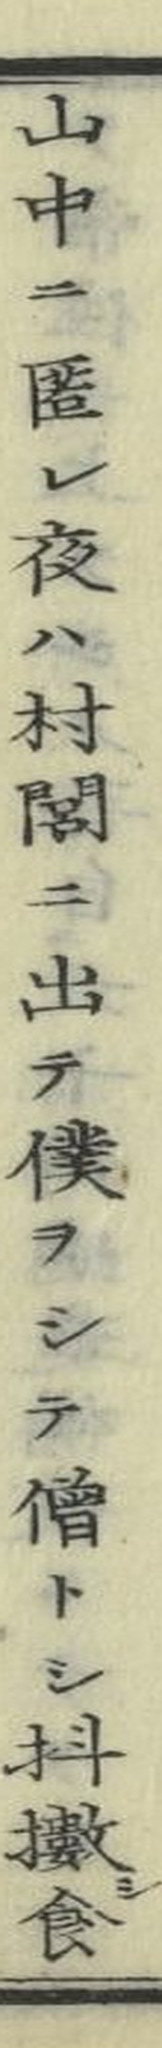山中ニ匿レ夜ハ村閭ニ出テ僕ヲシテ僧トシ抖撤食
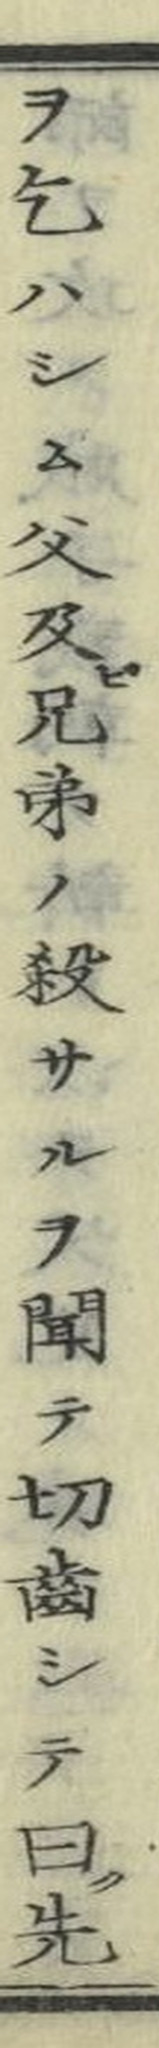ヲ乞ハシム父及兄弟ノ殺サルヲ聞テ切齒シテ曰先
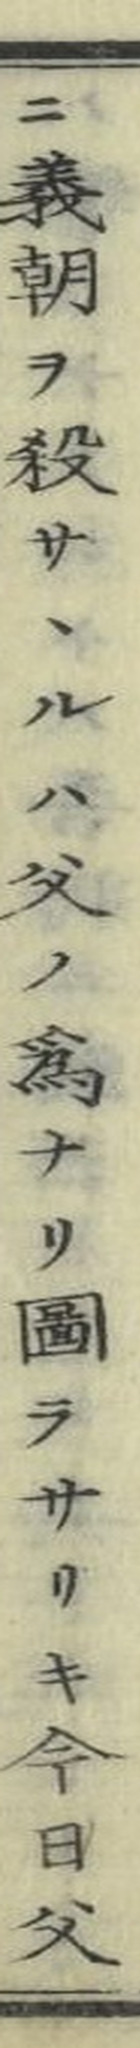ニ義朝ヲ殺サヽルハ父ノ爲ナリ圖ラサリキ今日父

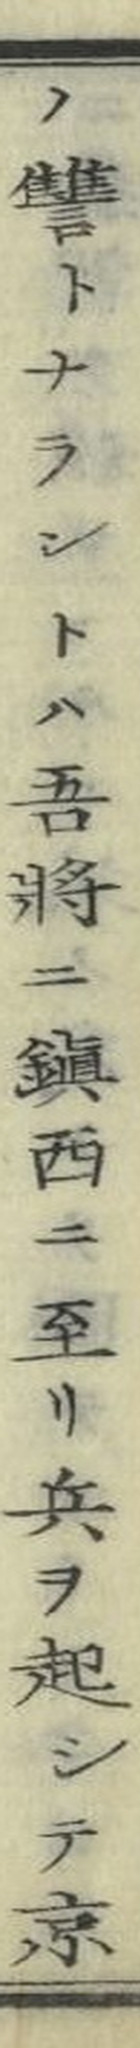ノ讐トナラントハ吾將ニ鎭西ニ至リ兵ヲ起シテ京
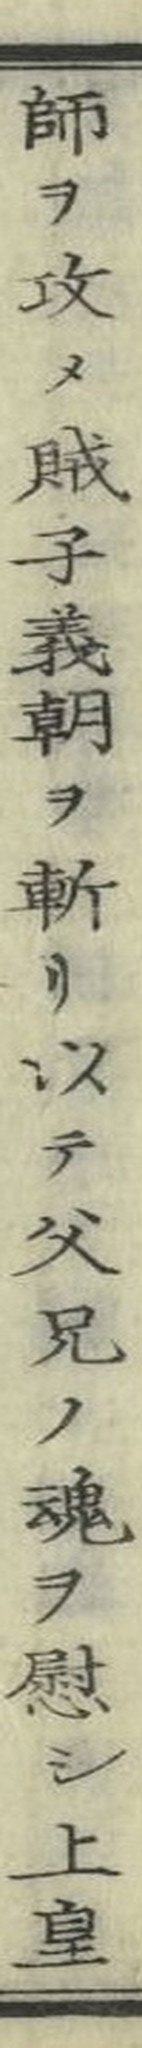師ヲ攻メ賊子義朝ヲ斬リ以テ父兄ノ魂ヲ慰シ上皇
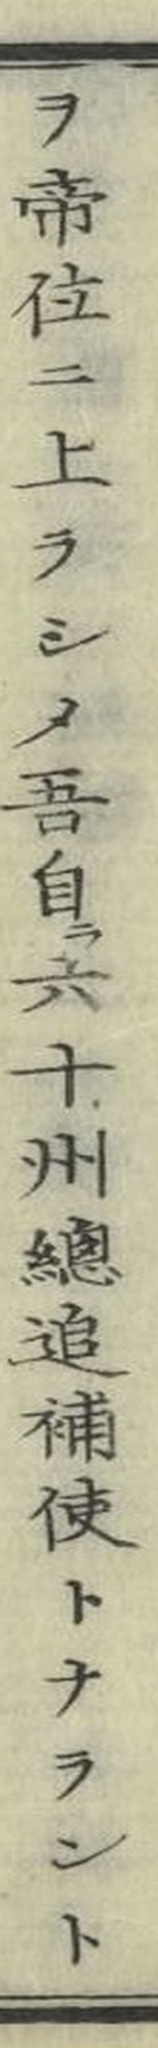ヲ帝位ニ上ラシメ吾自六十州總追補使トナラント
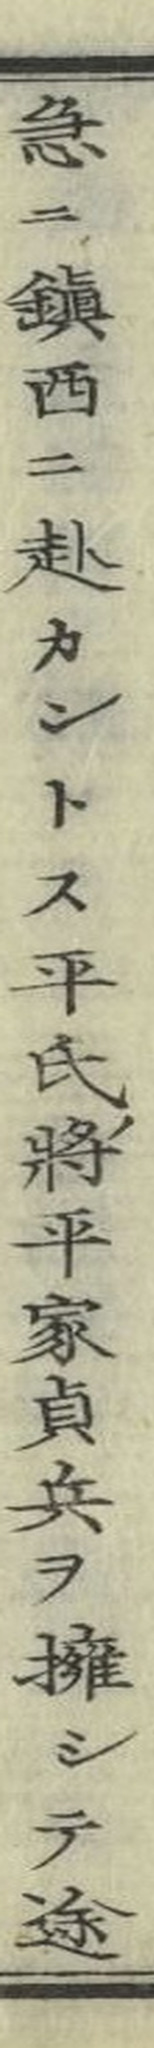急ニ鎭西ニ赴カントス平氏將平家貞ヲ擁シテ途
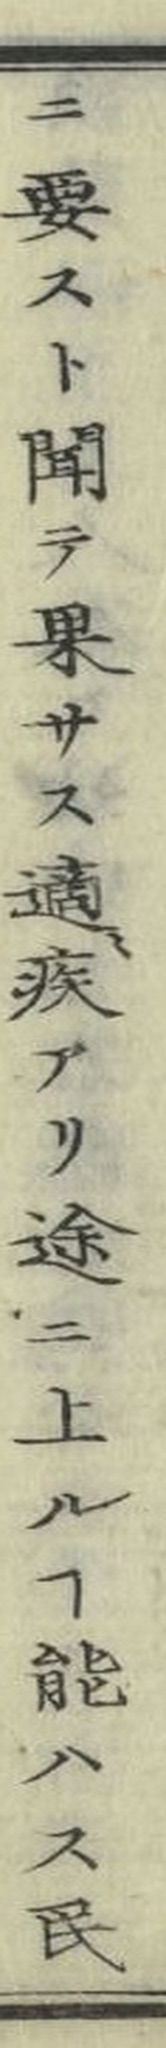ニ要スト聞テ果サス適〻疾アリ途ニ上ルコト能ハス民
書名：琉球藩史 一之巻
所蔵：University of the Ryukyus Library
